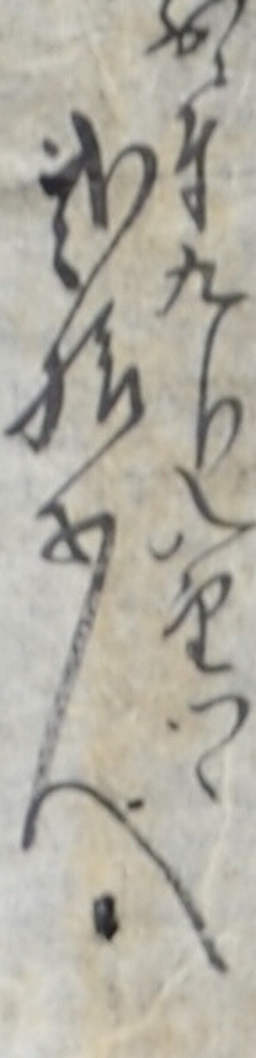弐拾五人
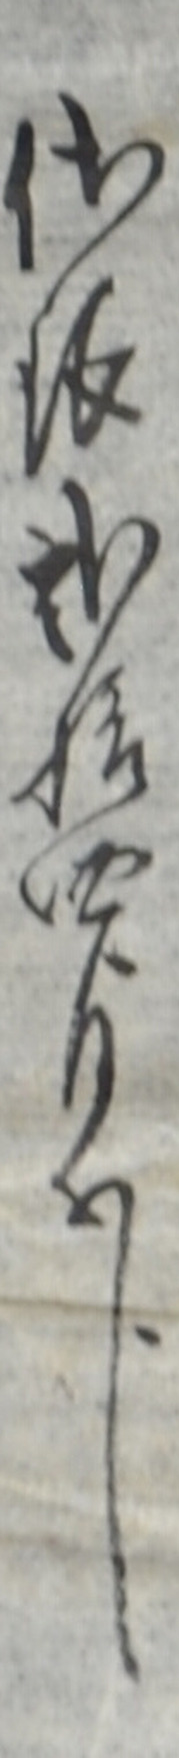代銀弐拾四匁五分
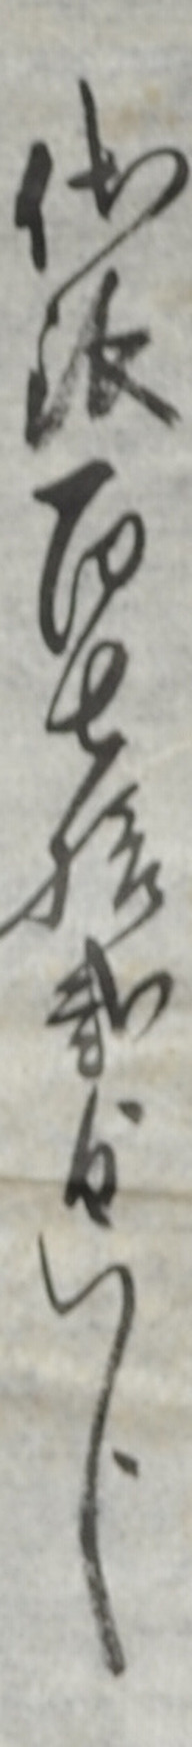代銀百七拾弐匁八分
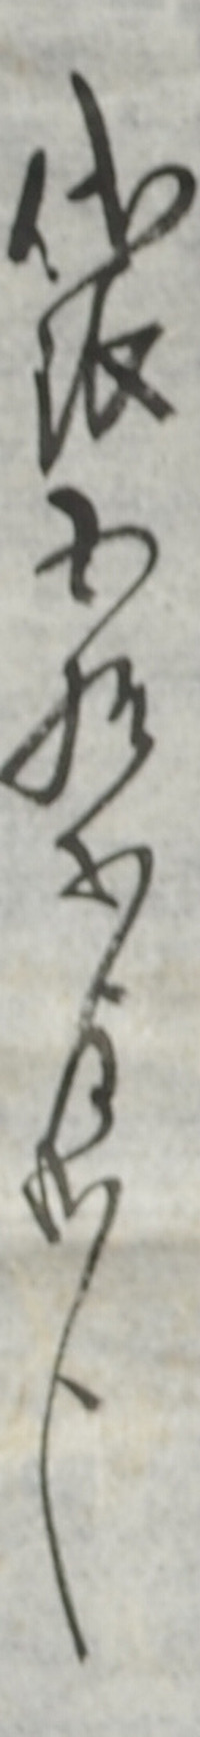代銀五拾五匁弐分
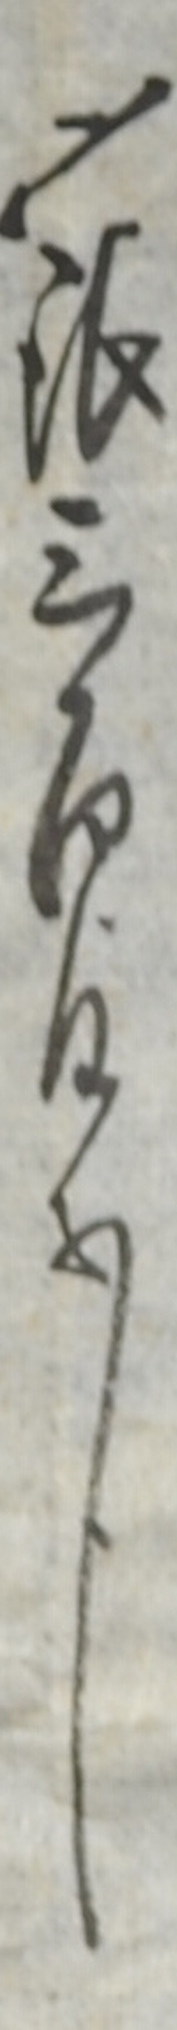〆銀三百匁五分
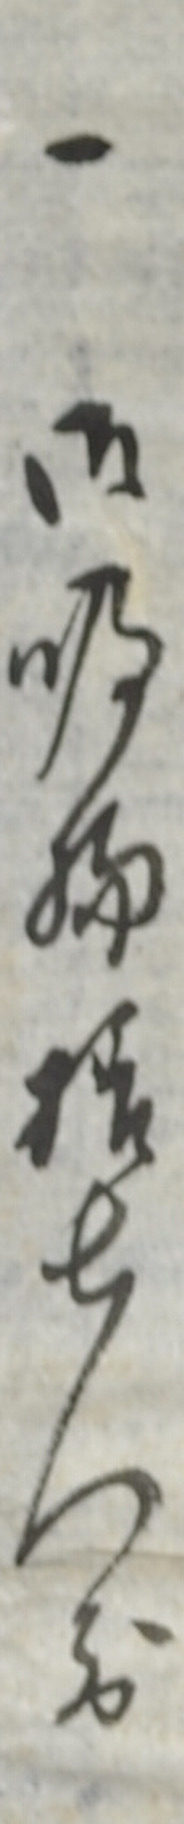一御吸物拾七人前
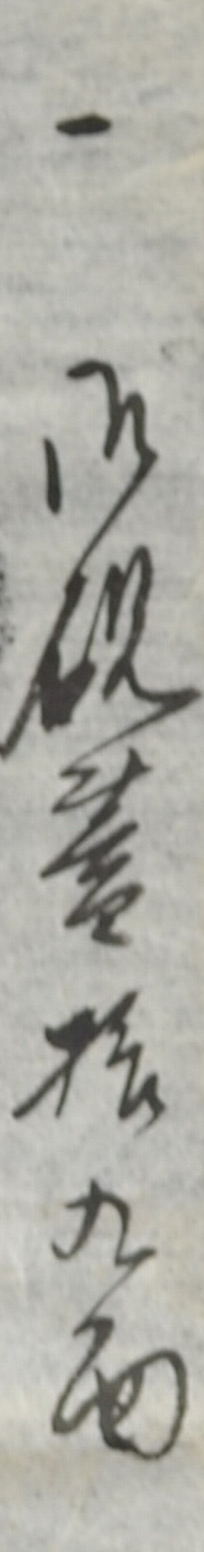一御硯蓋拾九面
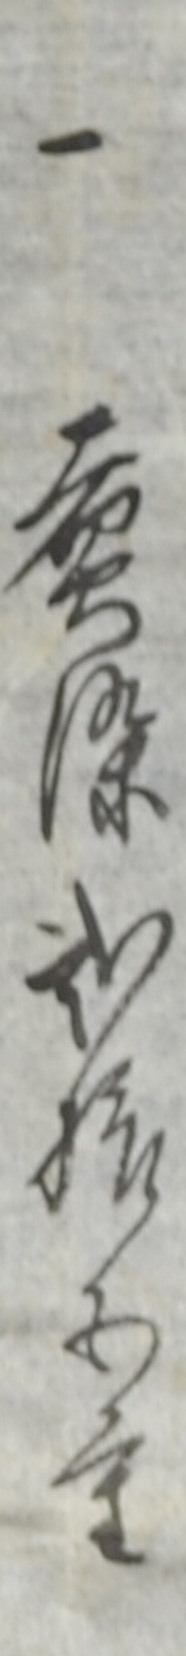一煮染弐拾五重
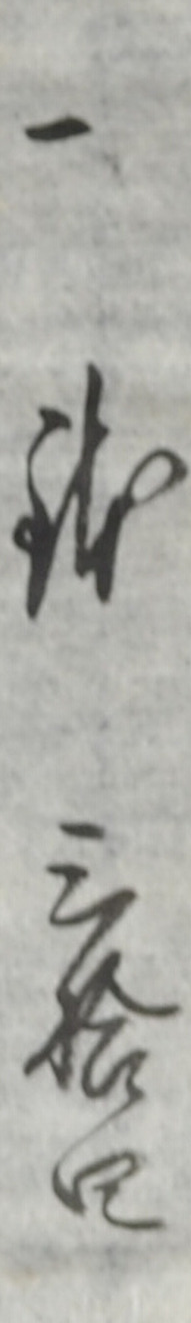一鉢三拾四
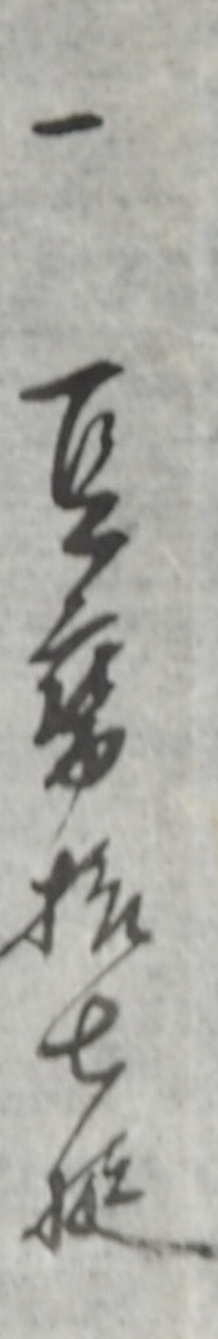一豆腐拾七挺
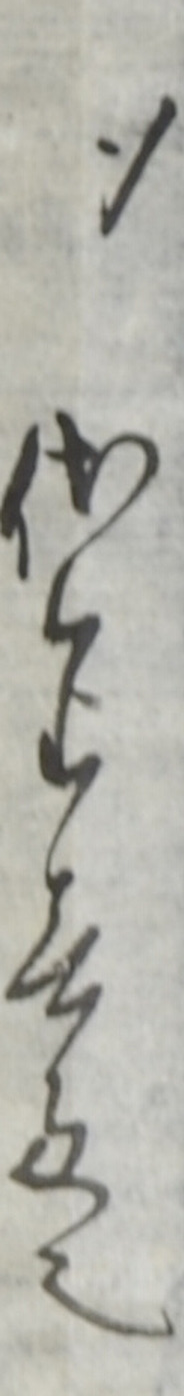〆代金壱両也
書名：覺
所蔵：伊那市立高遠町図書館・合同会社AMANE
